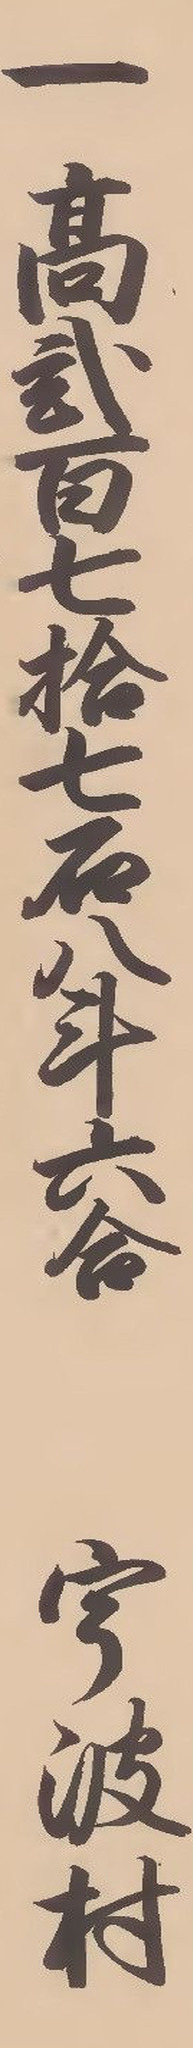一高弐百七拾七石八斗六合宇波村
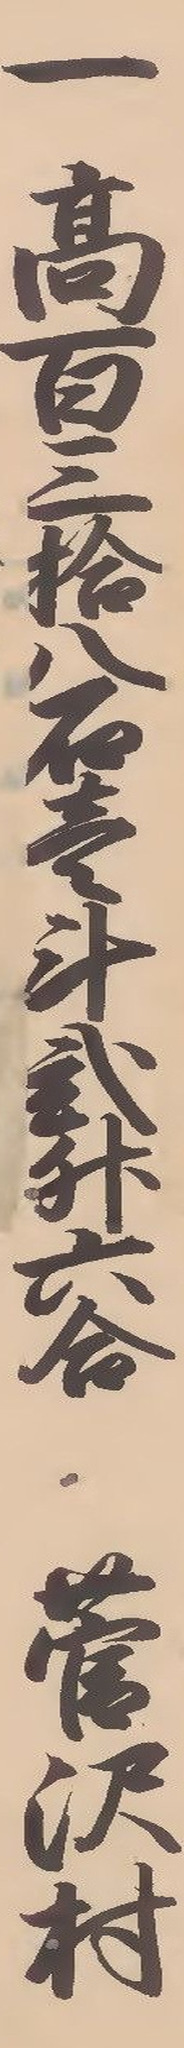一高百三拾八石壱斗弐升六合菅沢村

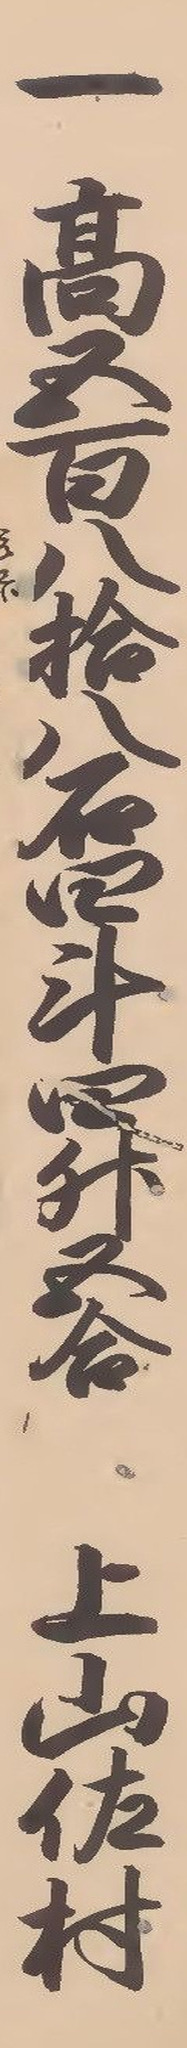一高五百八拾八石四斗四升五合上山佐村
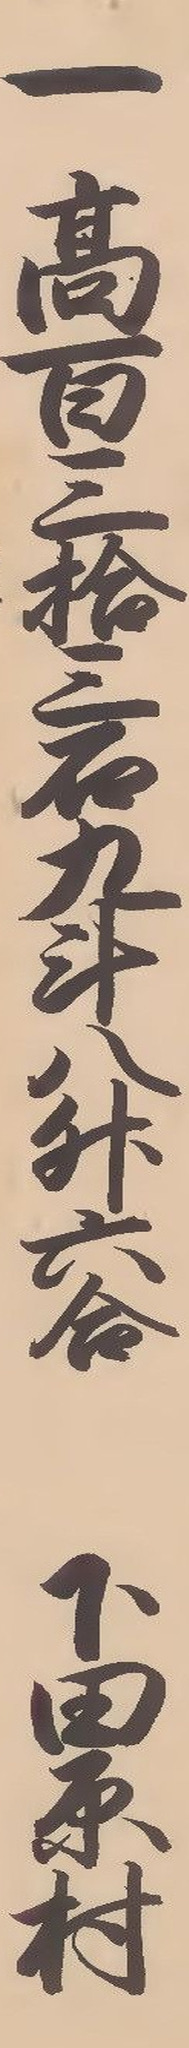一高百三拾三石九斗八升六合下田原村
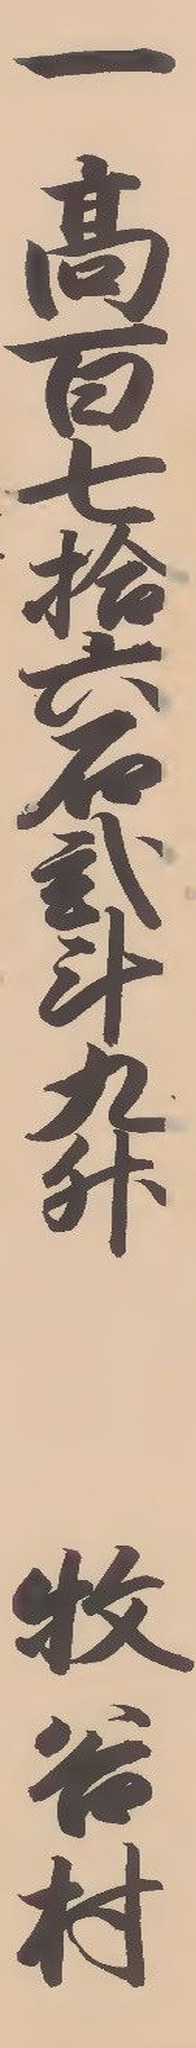一高百七拾六石弐斗九升牧谷村
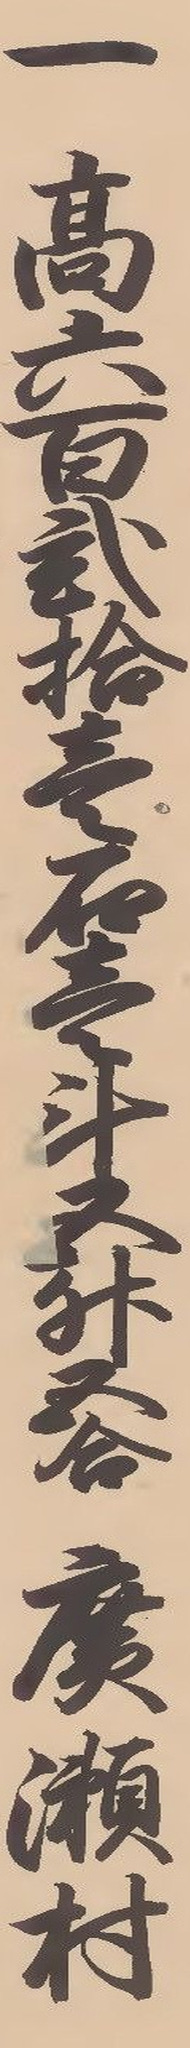一高六百弐拾壱石壱斗五升五合広瀬村

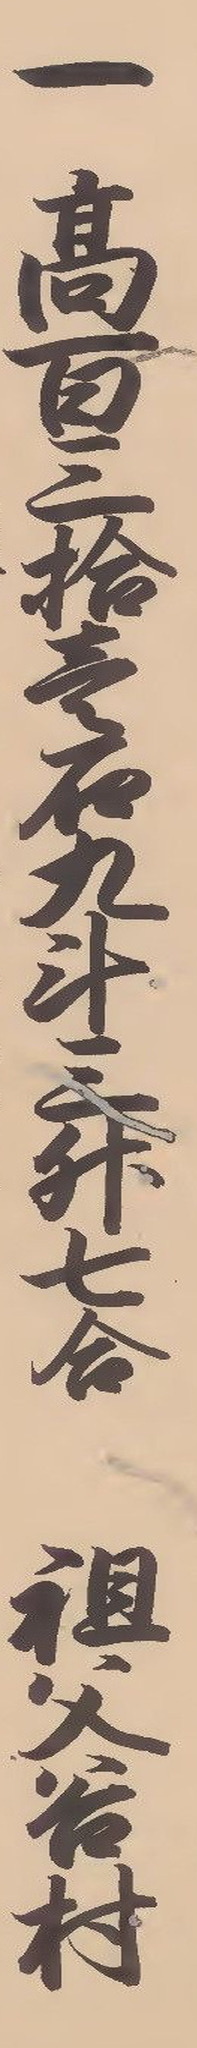一高百三拾壱石九斗三升七合祖父谷村
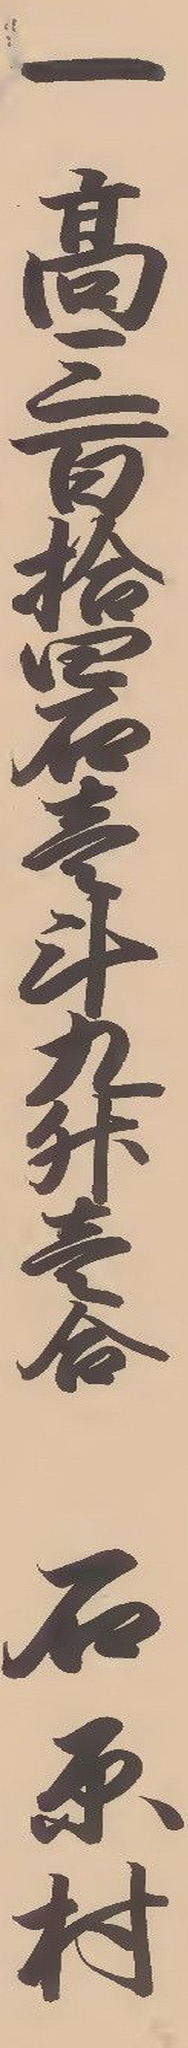一高三百拾四石壱斗九升壱合石原村
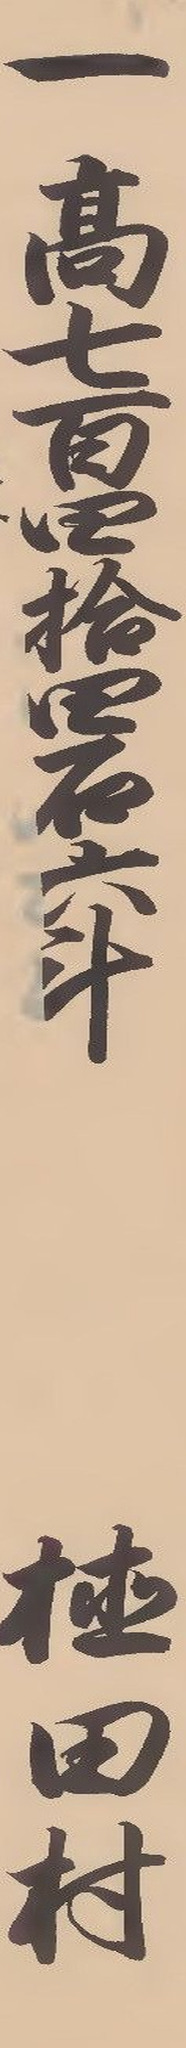一高七百四拾四石六斗植田村
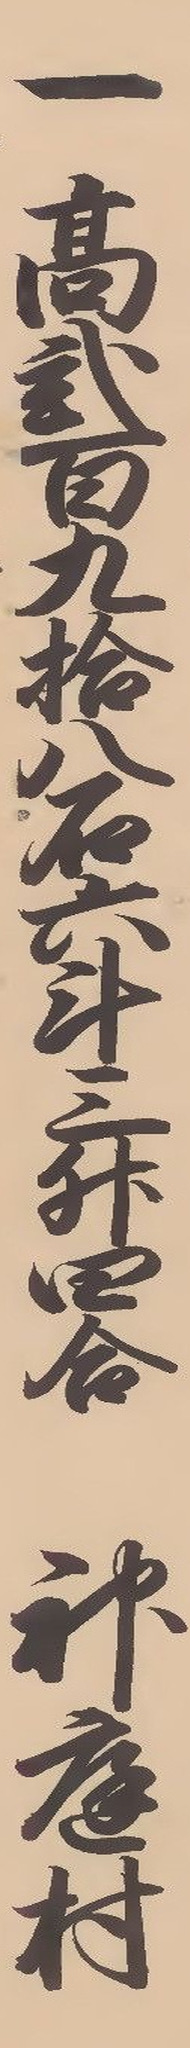一高弐百九拾八石六斗三升四合神庭村
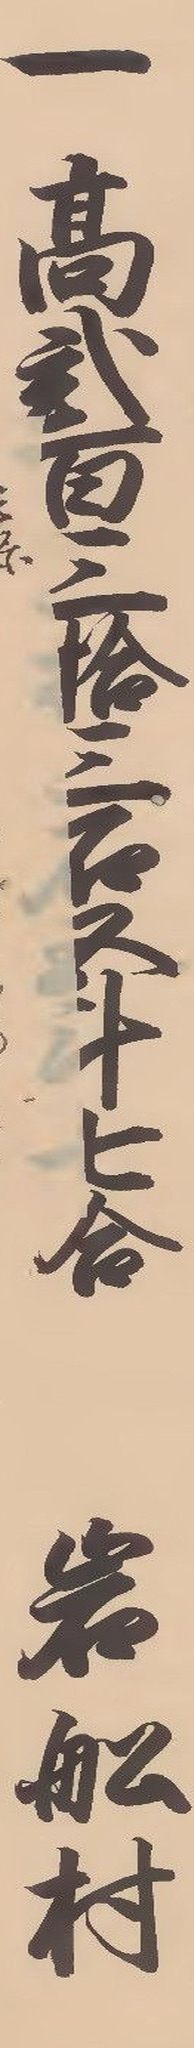一高弐百三拾三石五斗七合岩船村
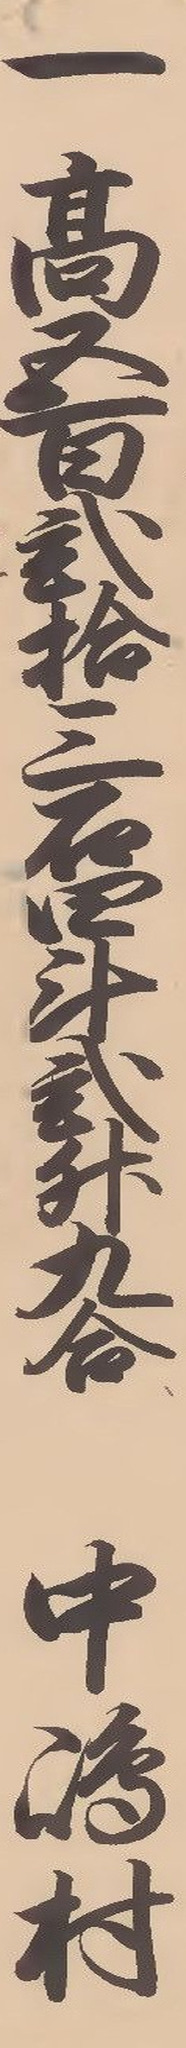一高五百弐拾三石四斗弐升九合中島村

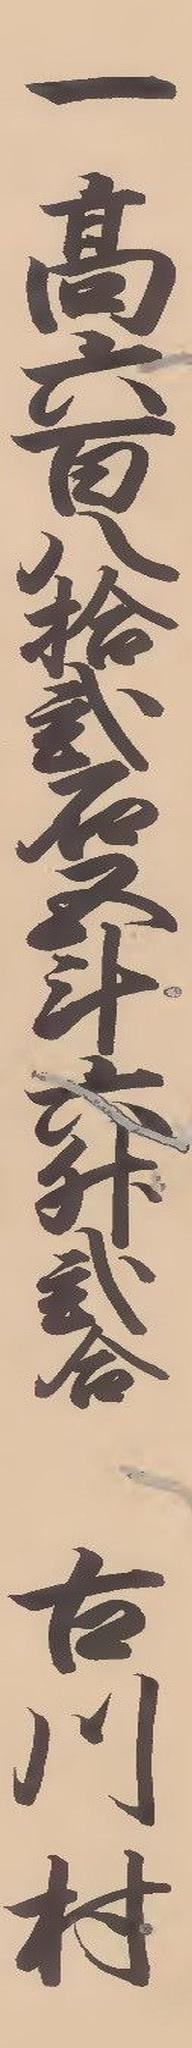一高六百八拾弐石五斗六升弐合古川村
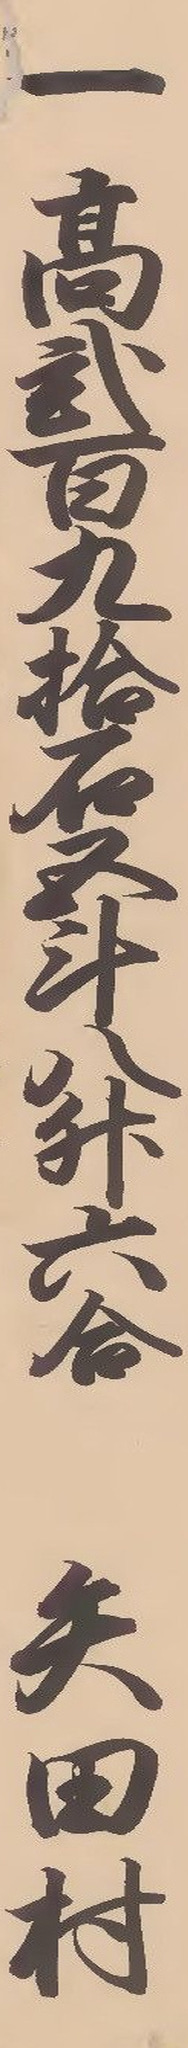一高弐百九拾石五斗八升六合矢田村
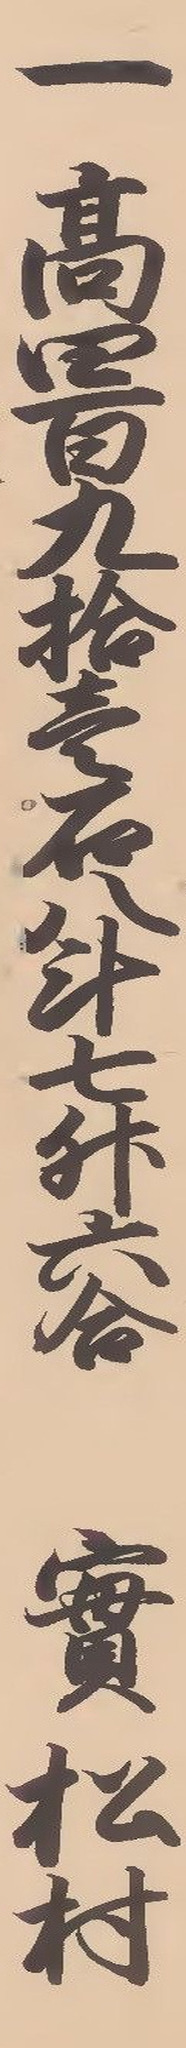一高四百九拾壱石八斗七升六合実松村
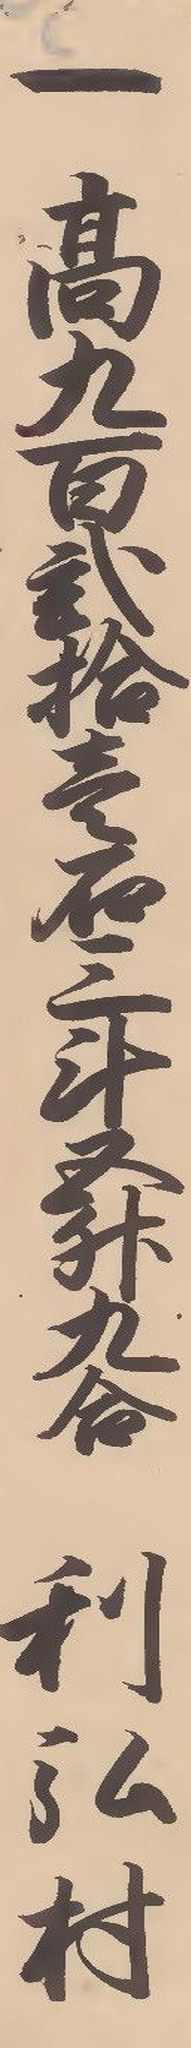一高九百弐拾壱石三斗五升九合利弘村
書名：出雲国郷帳
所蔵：国立公文書館 National Archives of Japan
